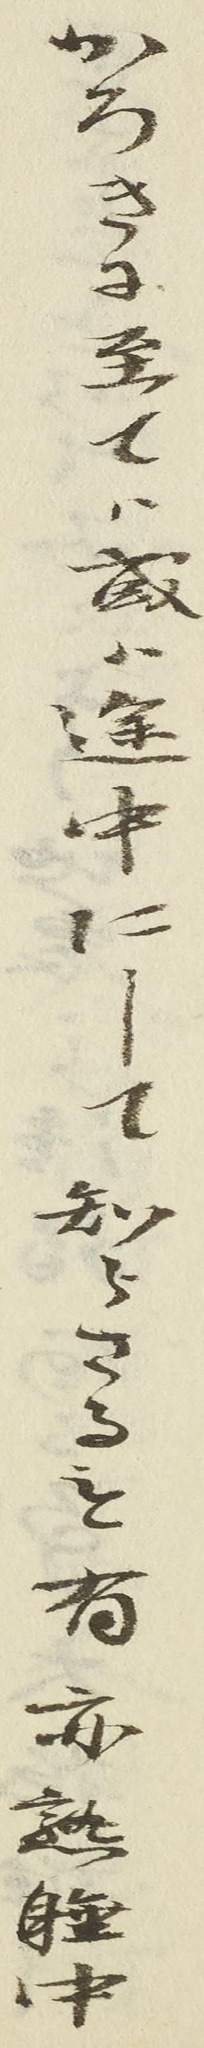かろきに至てハ或ハ途中にして知らさるも有亦熟睡中
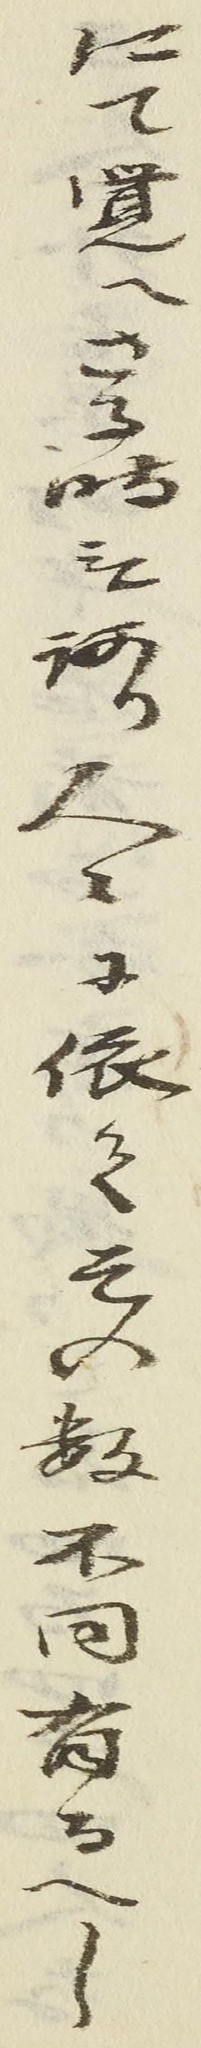にて覚へさる時もあり人堂に依てその数不同有るへし
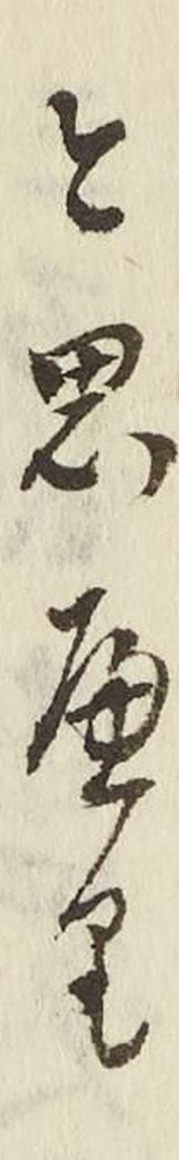と思へり
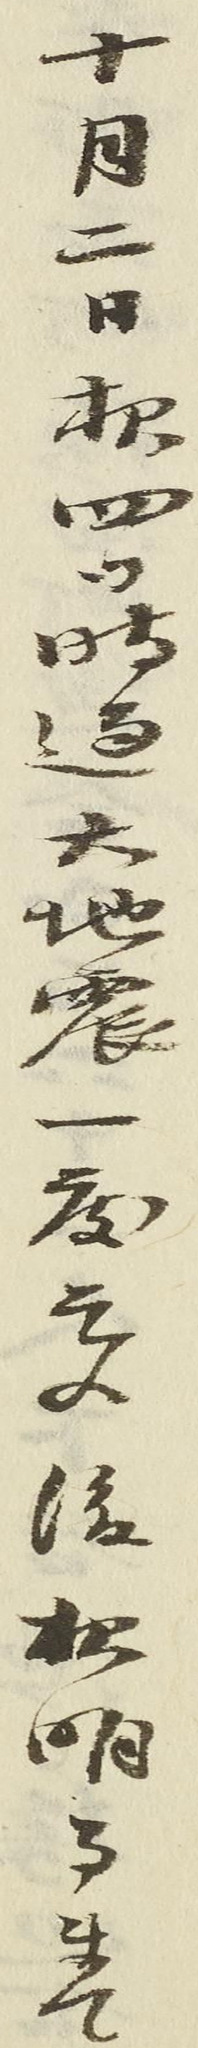十月二日夜四ッ時過大地震一度その後夜明るまで
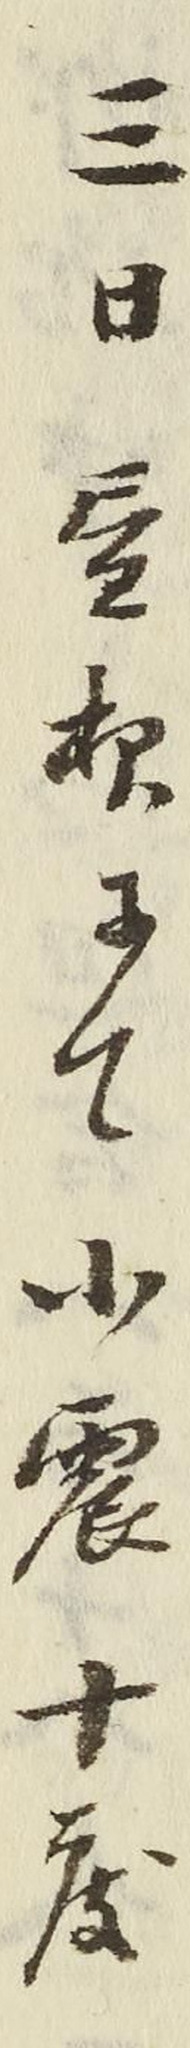三日昼夜にて小震十度
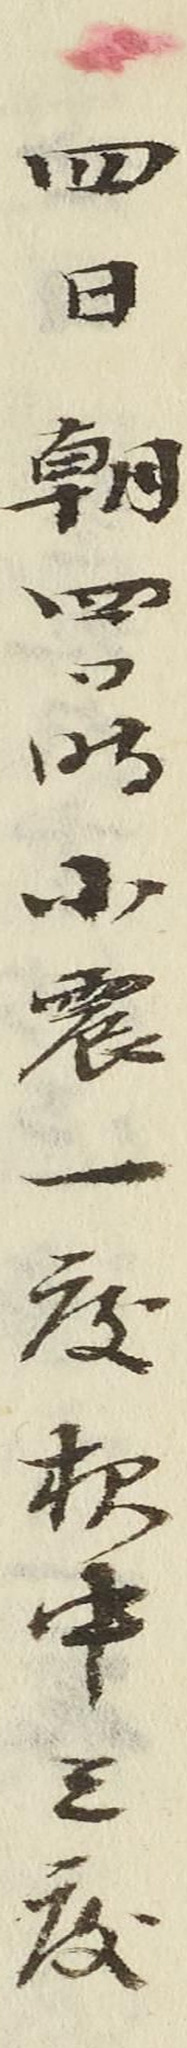四日朝四ッ時小震一度夜中三度
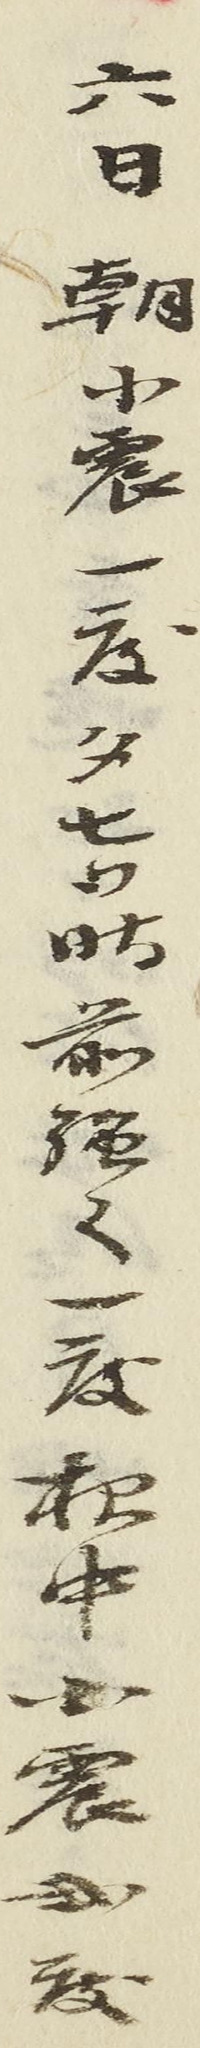五日朝小震一度夕七ッ時前強く一度夜中小震弐度
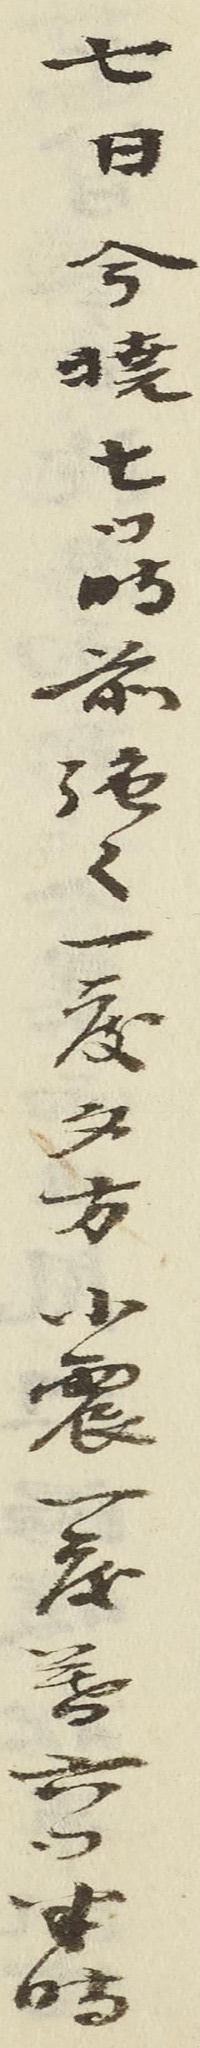七日今暁七ッ時前強く一度夕方小震一度暮六ッ半時
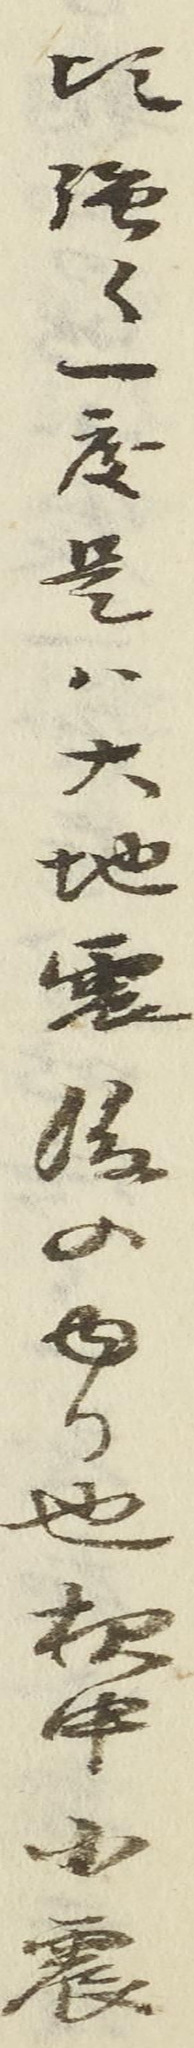頃強く一度是ハ大地震後のゆり也夜中小震
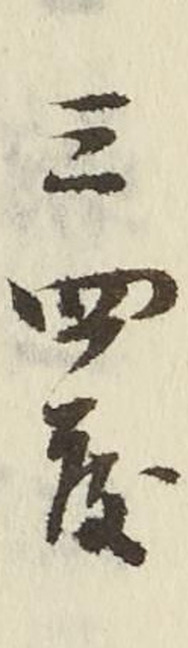三四度
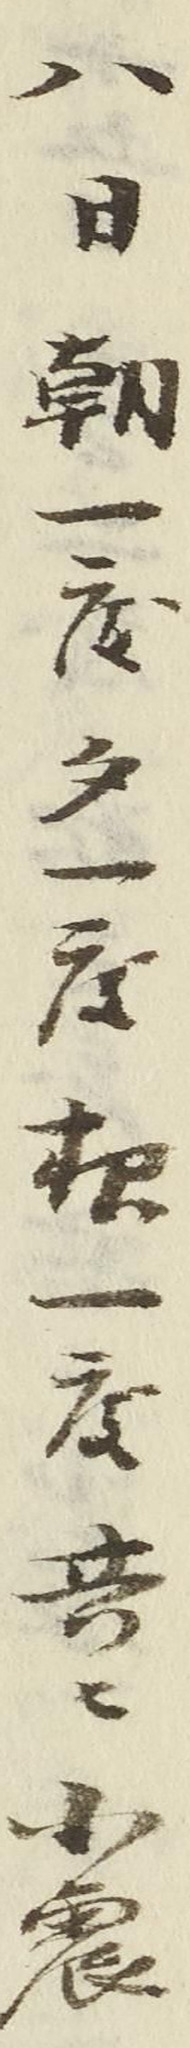八日朝一度夕一度夜一度と共二小震
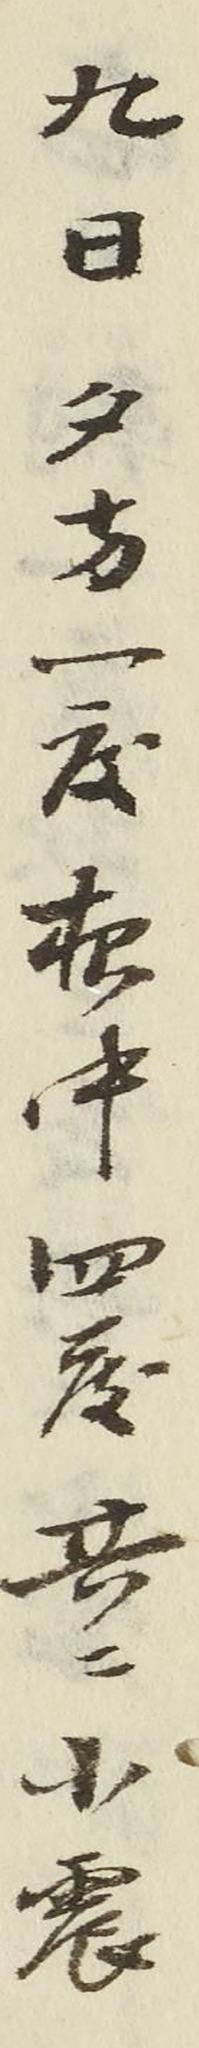九日夕方一度夜中四度共二小震
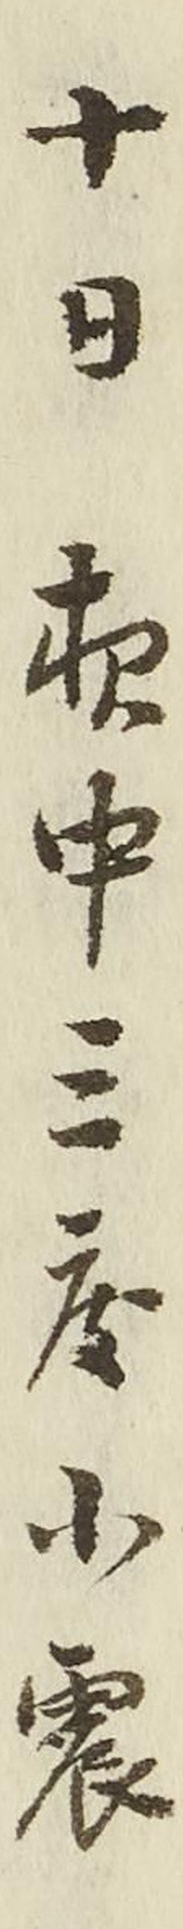十日夜中三度小震
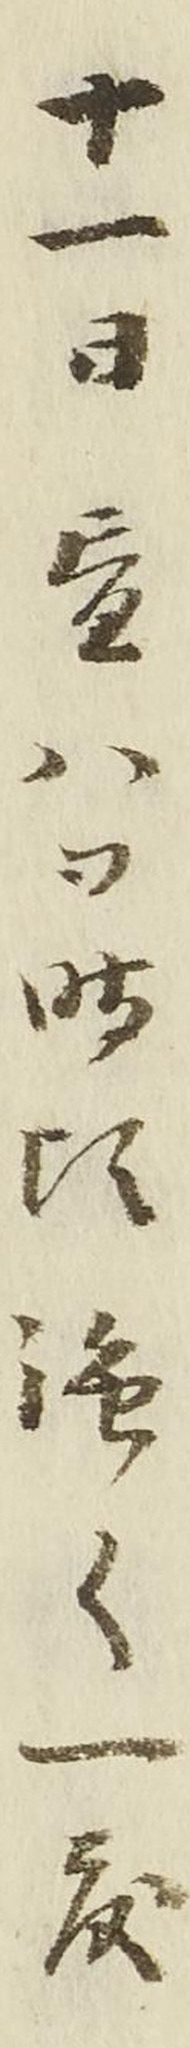十一日昼八ッ時頃強く一度

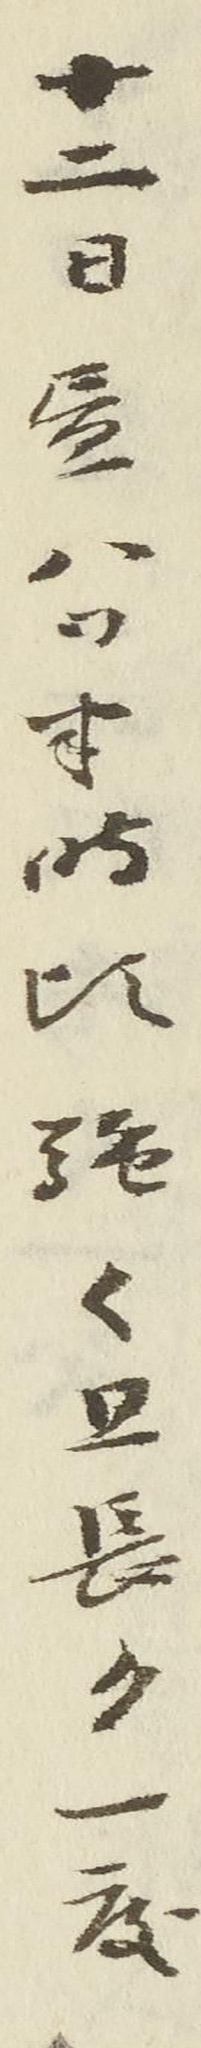十二日昼八ッ半時頃強く且長ㇰ一度
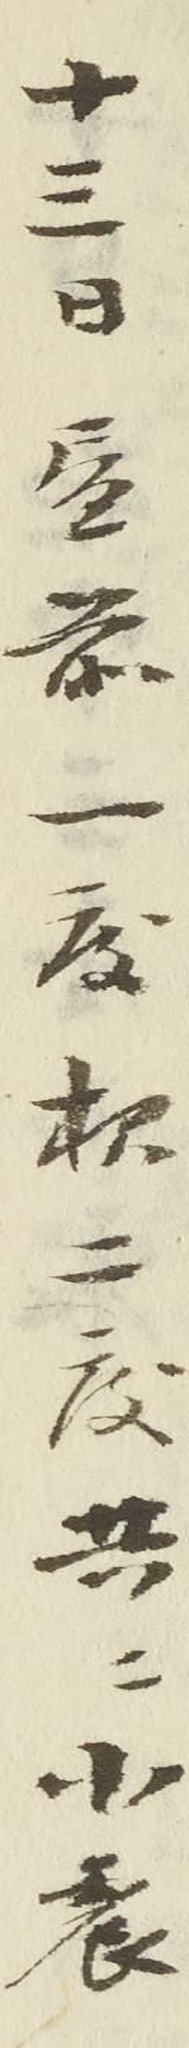十三日昼前一度夜二度共二小震
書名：那為の後見艸　全
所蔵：東京大学地震研究所図書室 Earthquake Research Institute Library, The University of Tokyo, JAPAN
